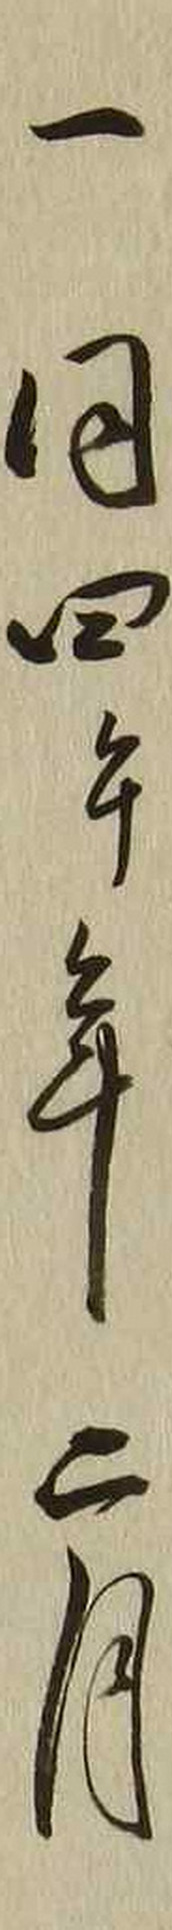一同四午年二月
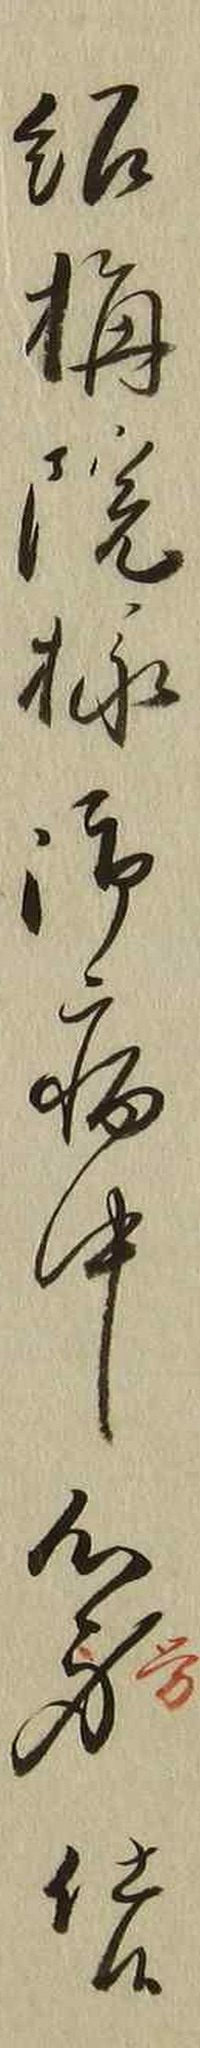紹栴院様御病中心労仕候
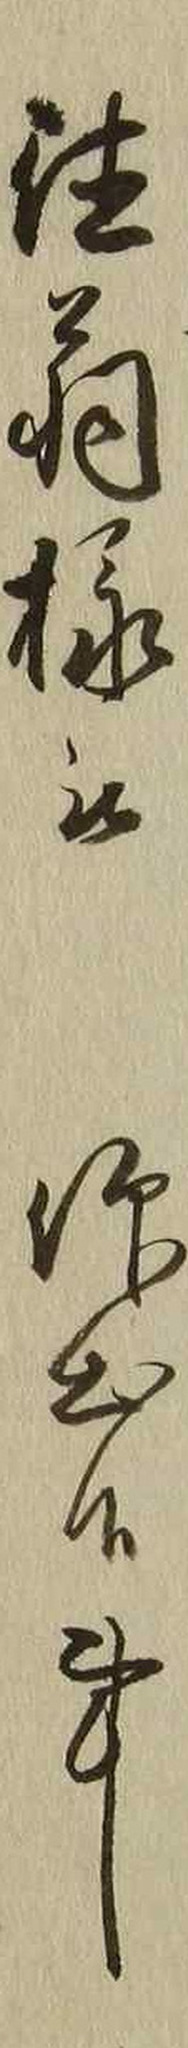徳翁様被仰出候事
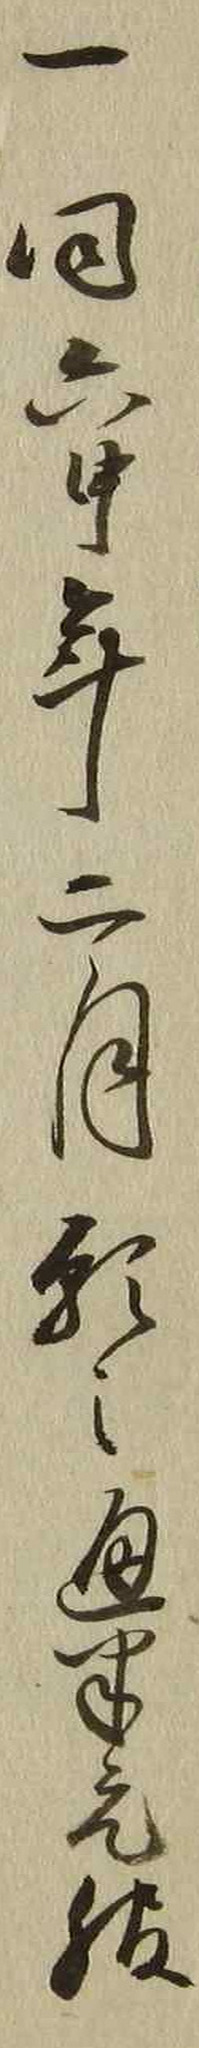一同六申年二月願之通半元服
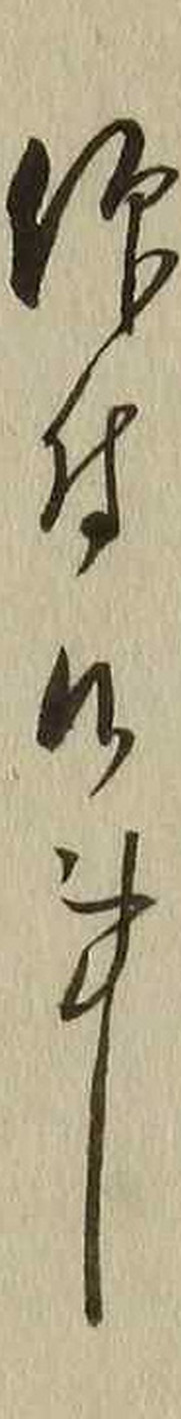仰付候事
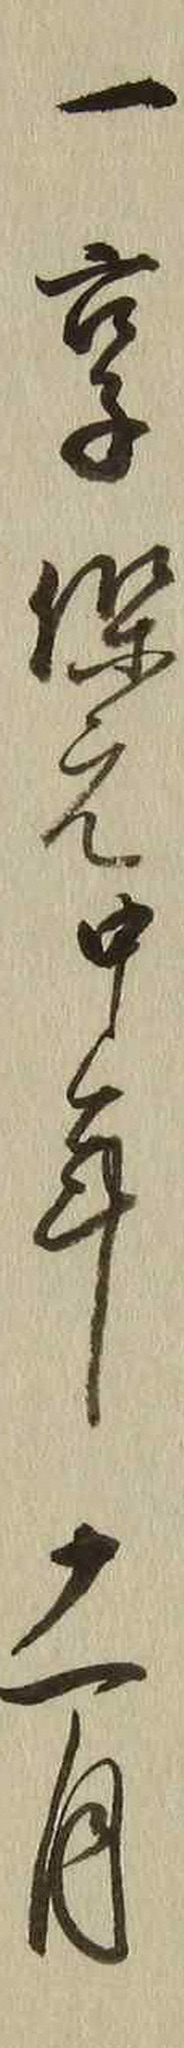一享保元年申年十一月
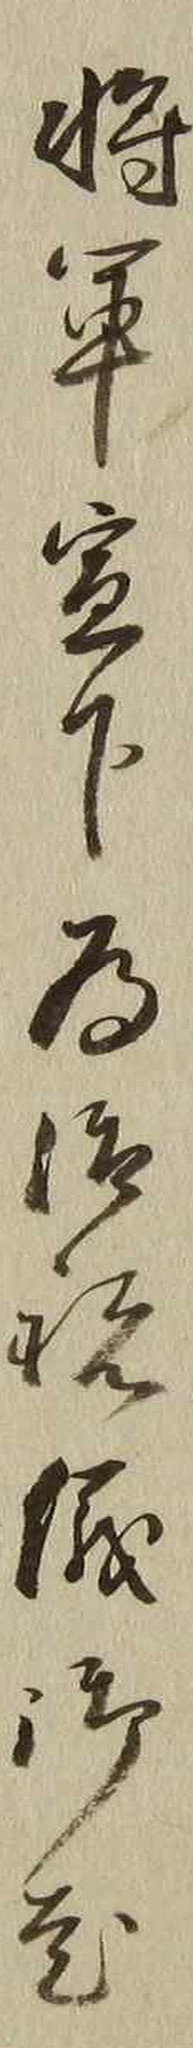将軍宣下為御祝儀御老
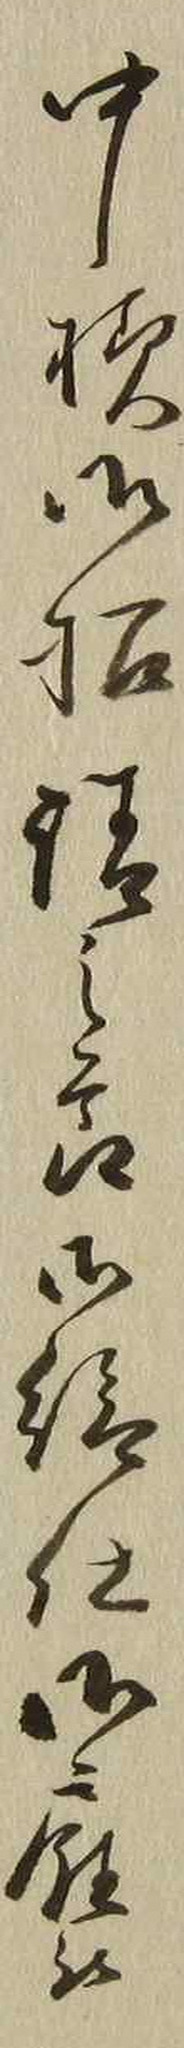中様御招請之節御給仕御雇被
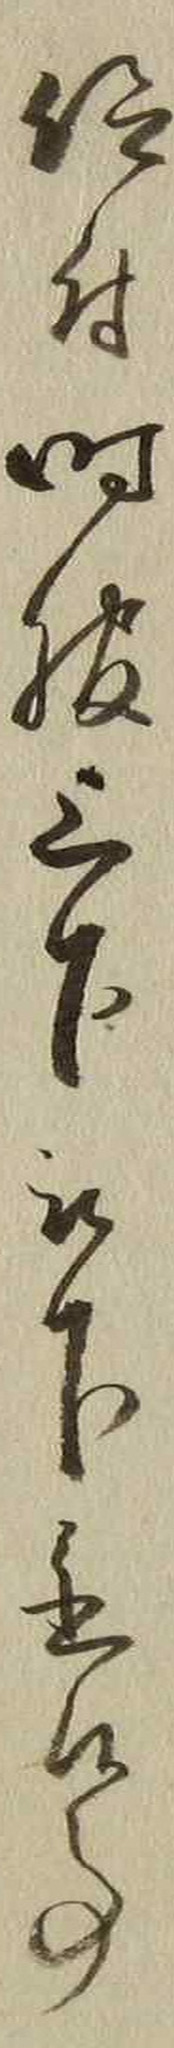仰付時服上下被下置候事
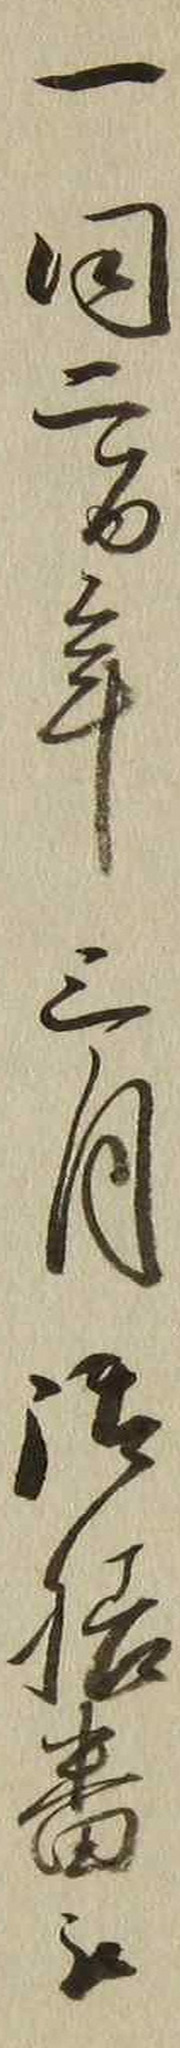一同二酉年三月御膳番被
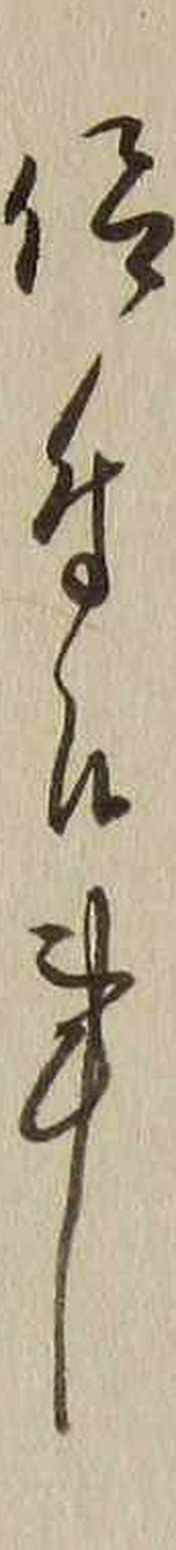仰付候事
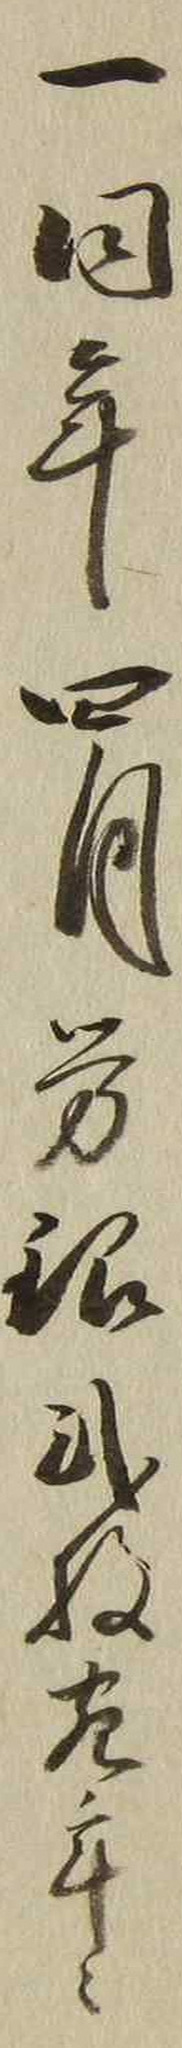一同年四月労銀弐枚宛年々
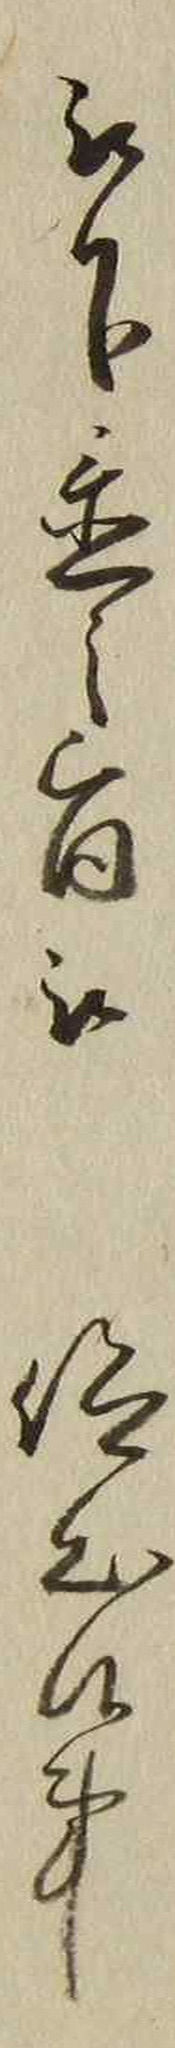被下置之旨被仰出候事
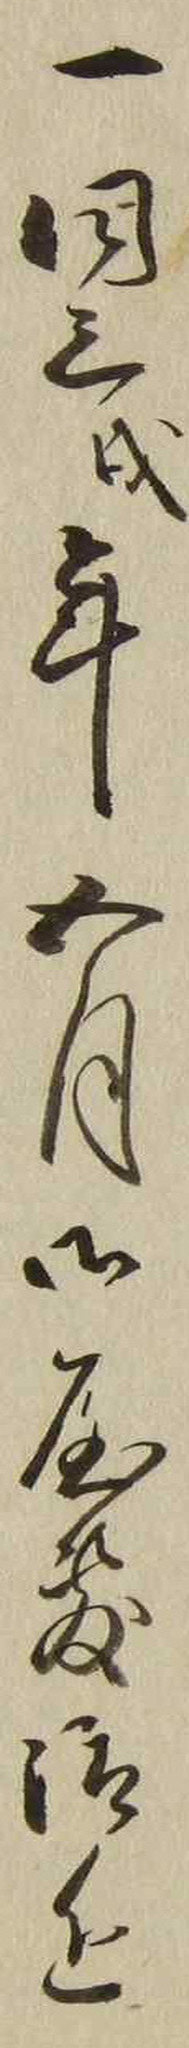一同三戌年五月御屋敷御近
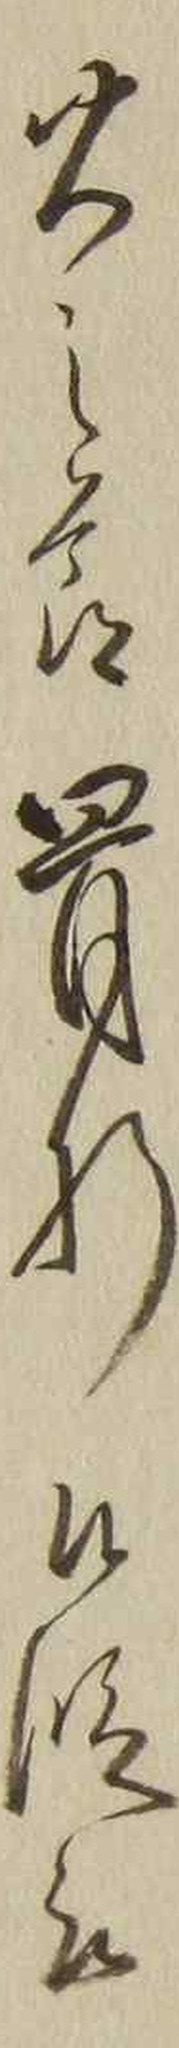火之節骨折候段被

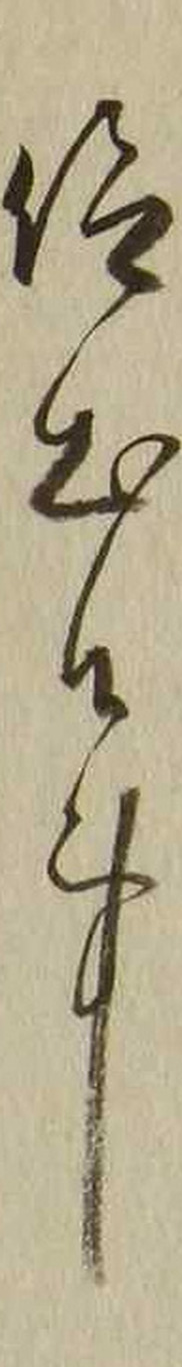仰出候事
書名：諸士系譜　巻之70　を之部4
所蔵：会津若松市立会津図書館
